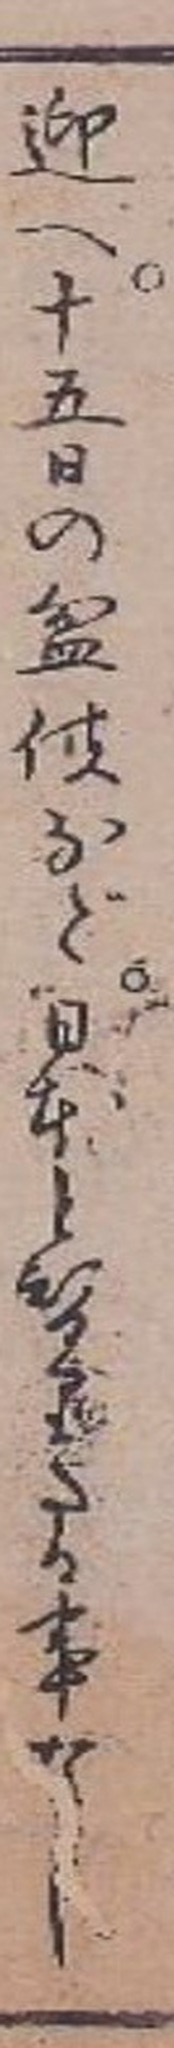迎へ、十五日の盆供など、日本と替りたる事なし
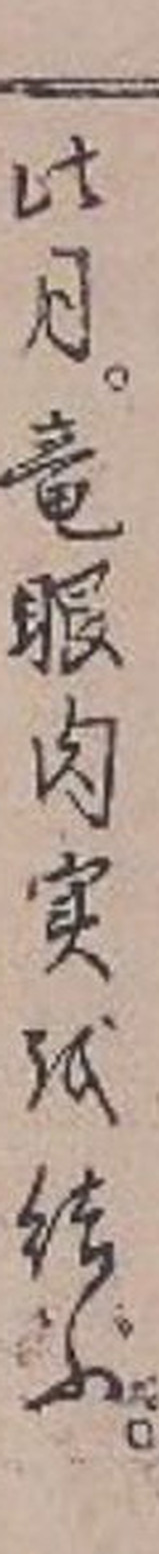此月、竜眼肉実を結ぶ、
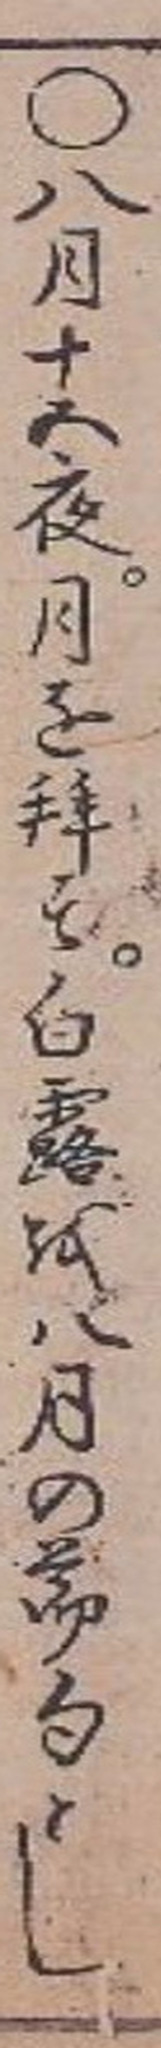○八月十五夜、月を拝す、白露を八月の節句とし
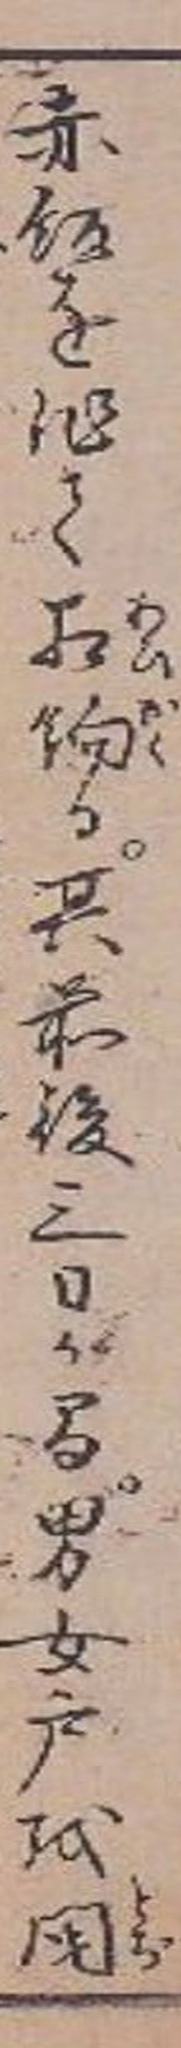赤飯を作て相餉る、其前後三日が間、男女戸を閉
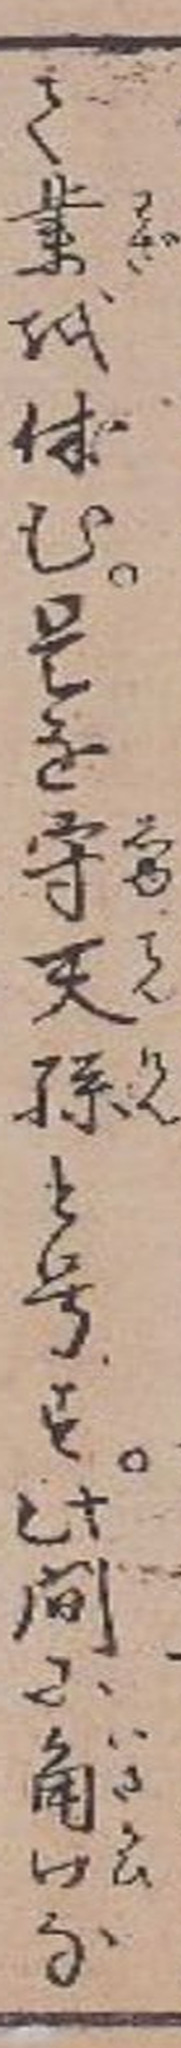て業を休む、是を守天孫と号す、此間に角口な
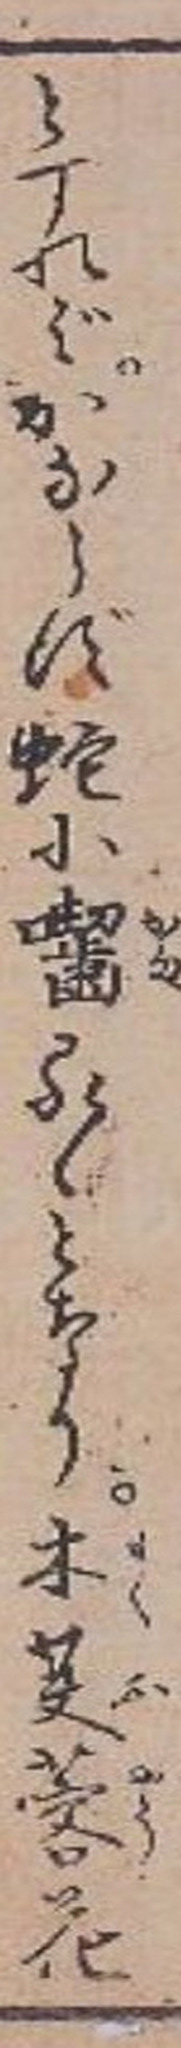とすれば、かならず蛇に噛るゝとなり、木芙蓉花
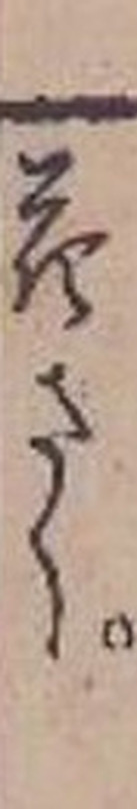花さく、
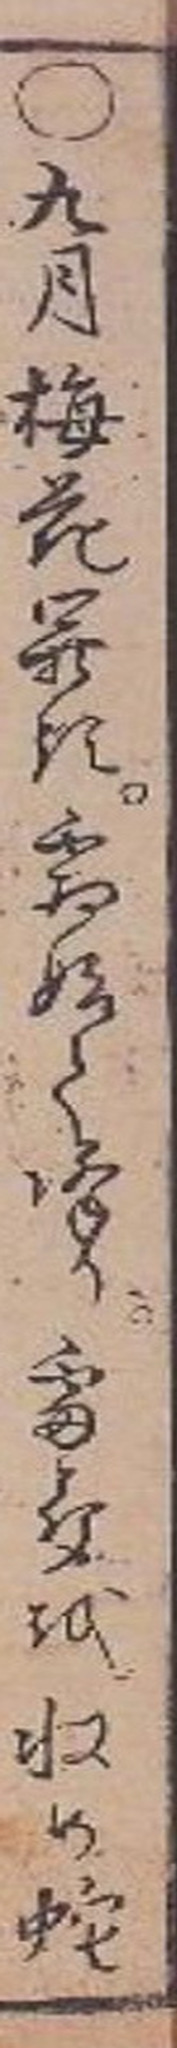○九月梅花開き、霜始て降り、雷声を収め蛇
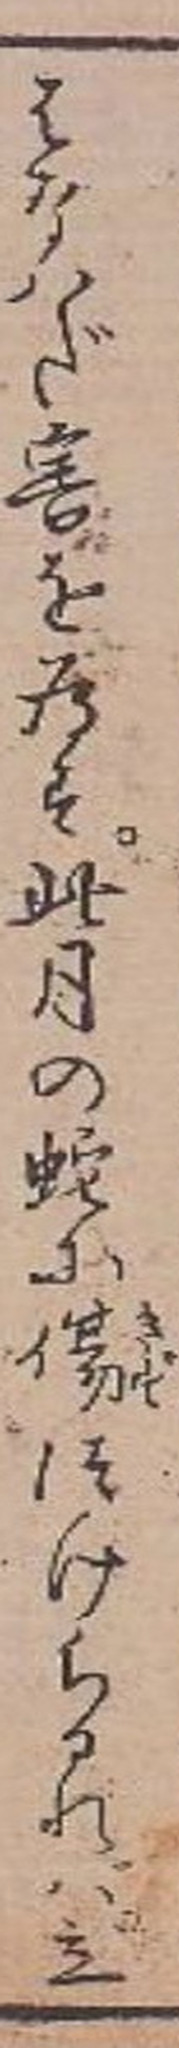はなはだ害を為す、此月の蛇に傷つけらるれば、立
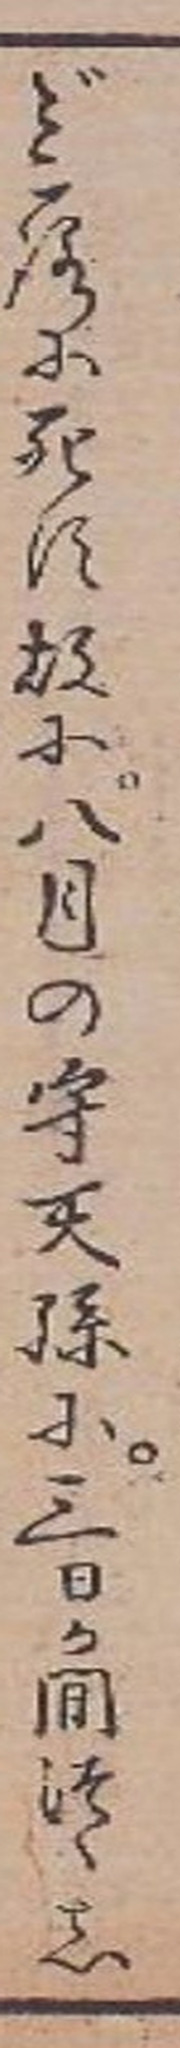どころに死す故に、八月の守天孫に、三日か間つゝし
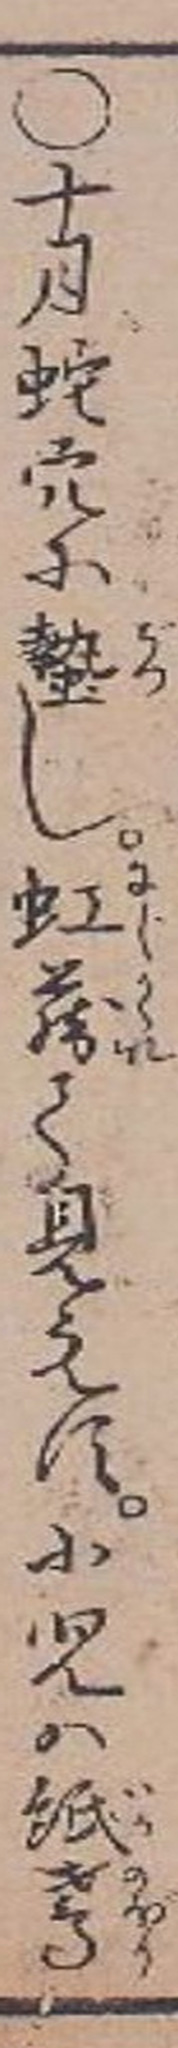○十月蛇穴に蟄し、虹蔵て見えす、小児は紙鳶
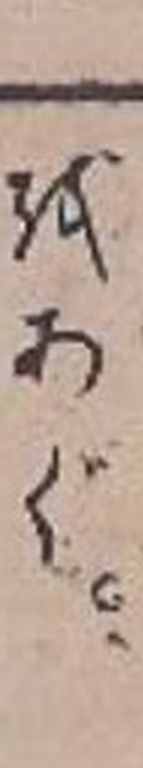をあぐ、
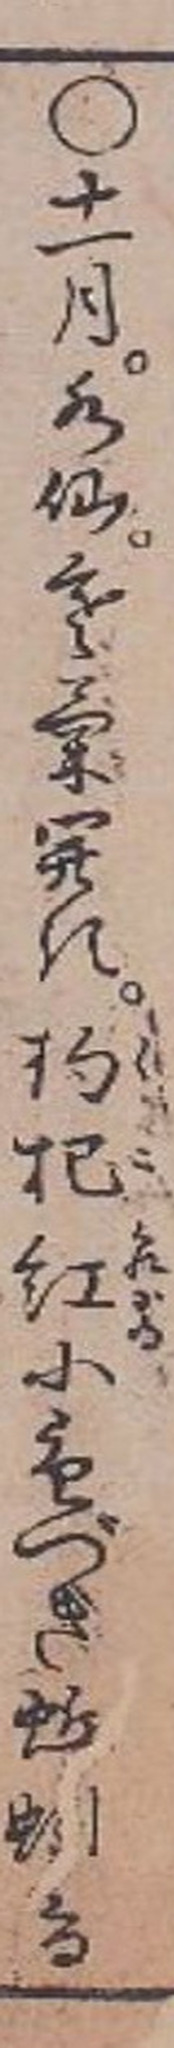○十一月、水仙、寒菊開き、枸杞紅に色づき蚯蚓咼
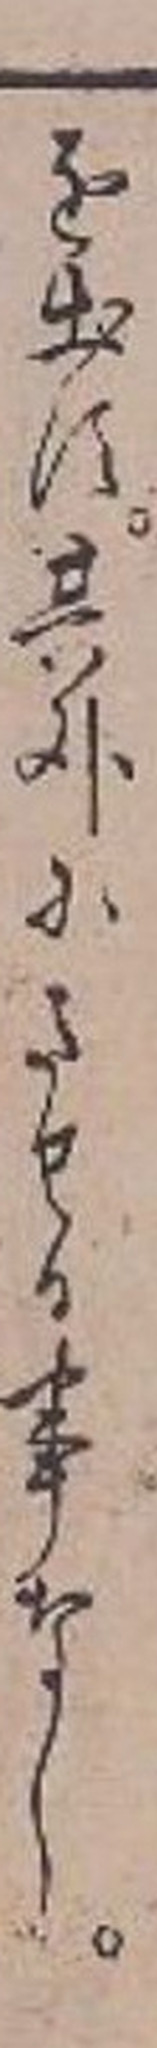を出す、其外にさせる事なし、
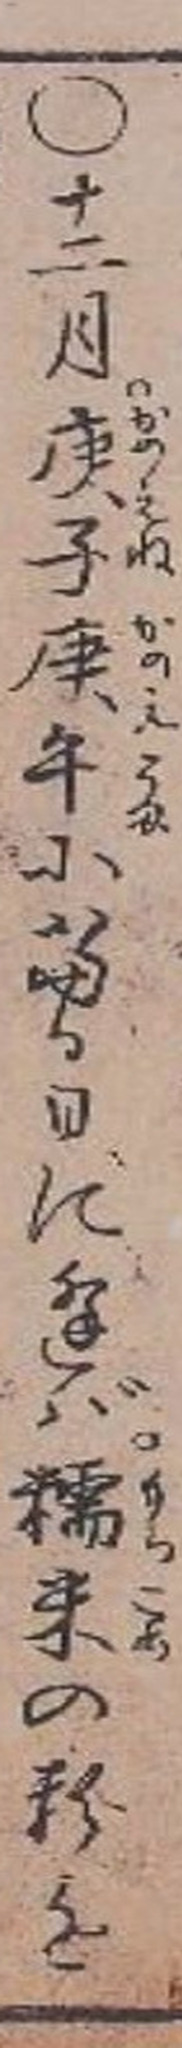○十二月、庚子庚午に当る日に逢ば、糯米の粉を
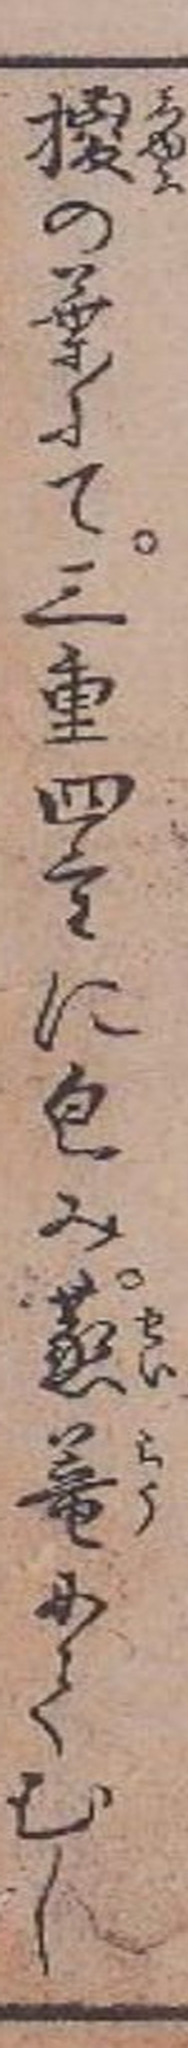椶の葉にて、三重四重に包み、蒸篭にてむし
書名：琉球談
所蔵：University of the Ryukyus Library
